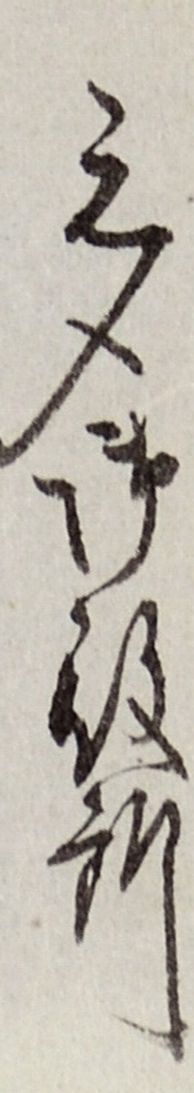元〆御役所
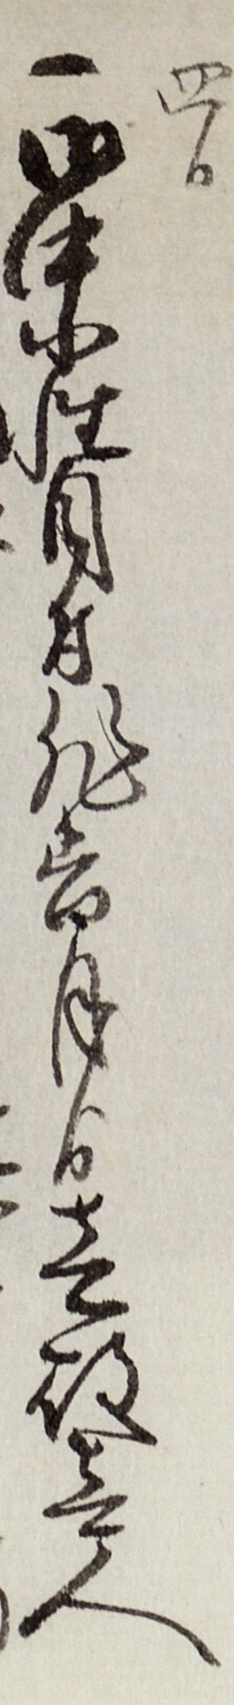一御中小性目付非番月ゟ壱役壱人
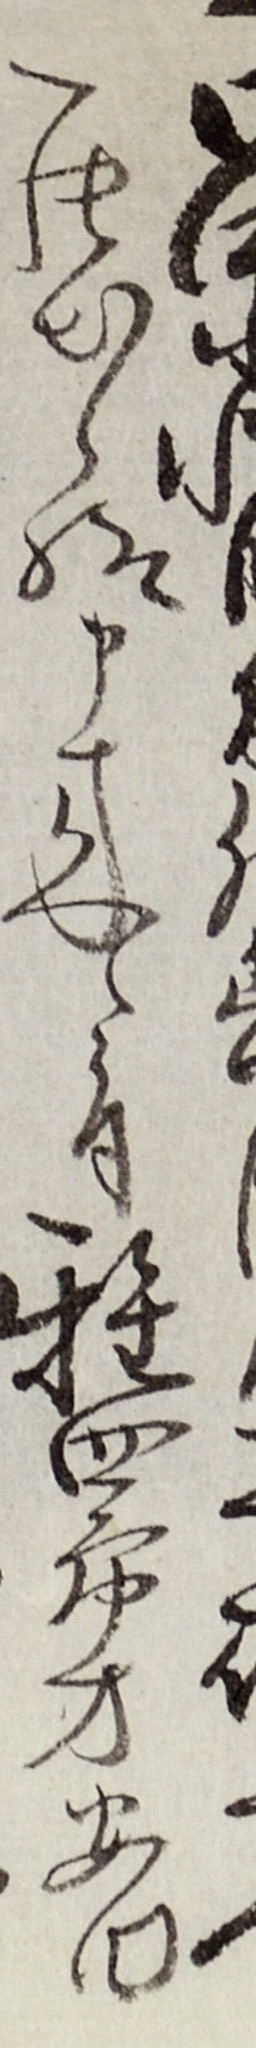罷出候様申来候ニ付雅四郎方安田
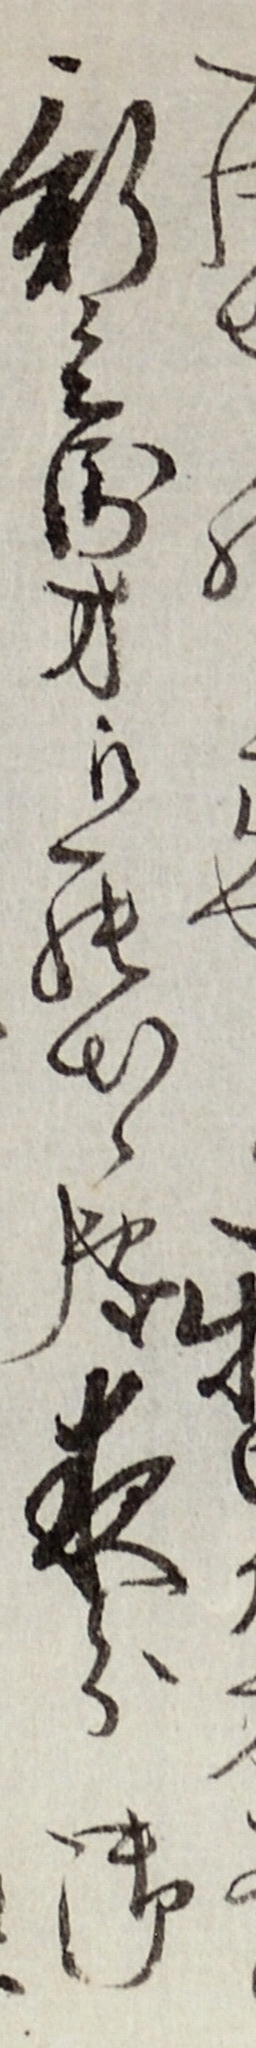新兵衛方江罷出候処夜分御
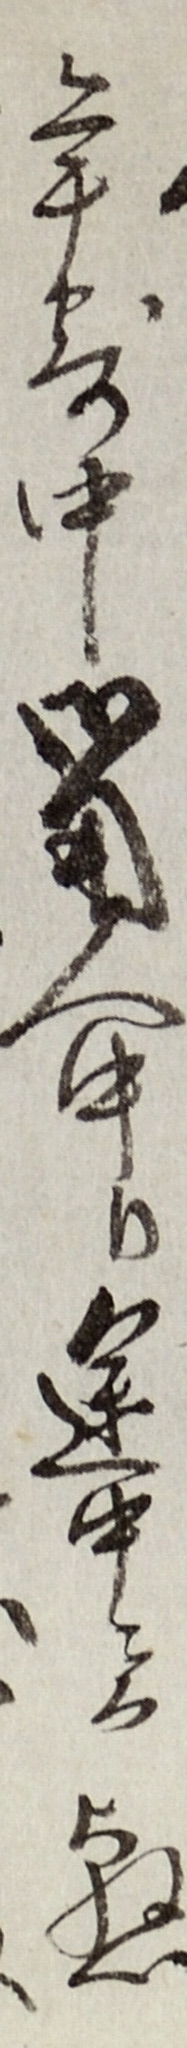年寄中御用人中江途中ニ而懸
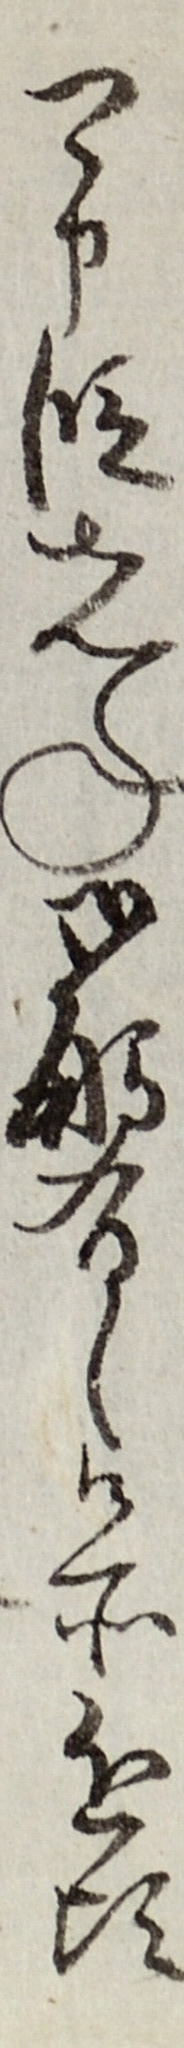可申段先年御触有之候所近頃
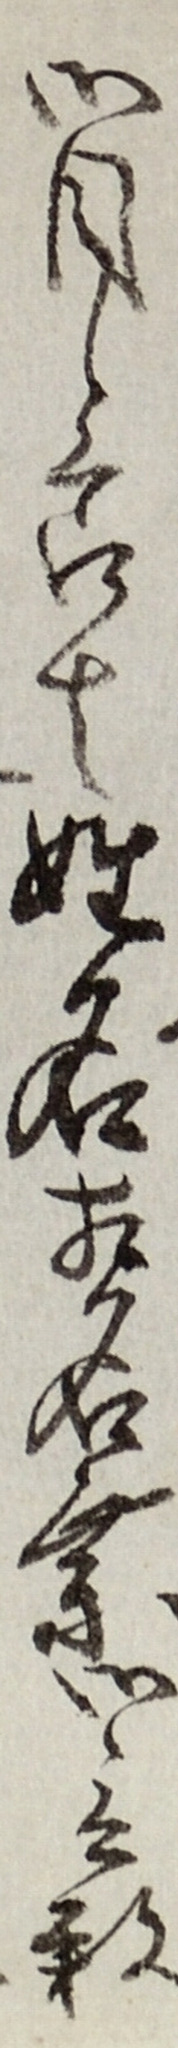御目候節者姓名相名乗御会釈
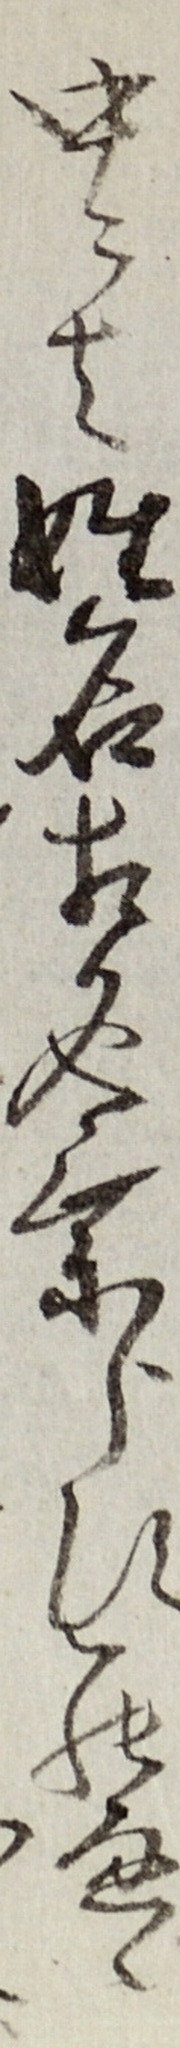中ニ者姓名相名乗らす罷通候
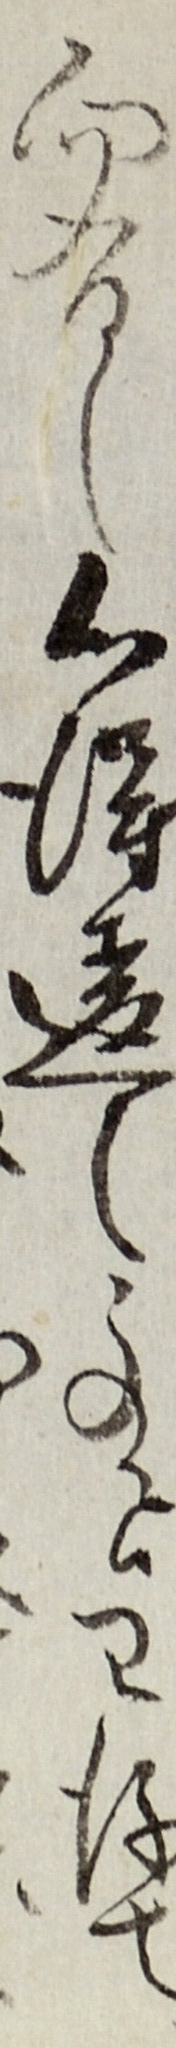向有之心得違之事ニ候已後者
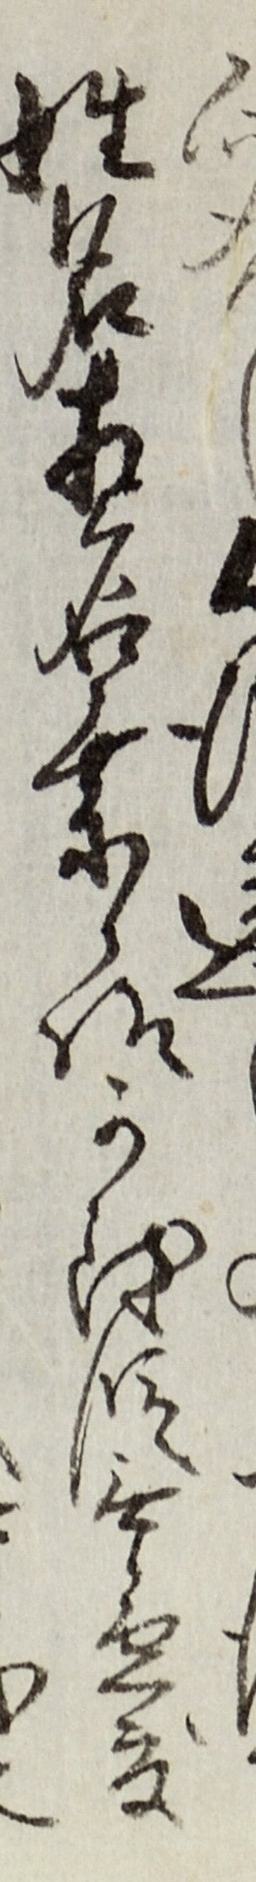姓名相名乗候様可致段無急度
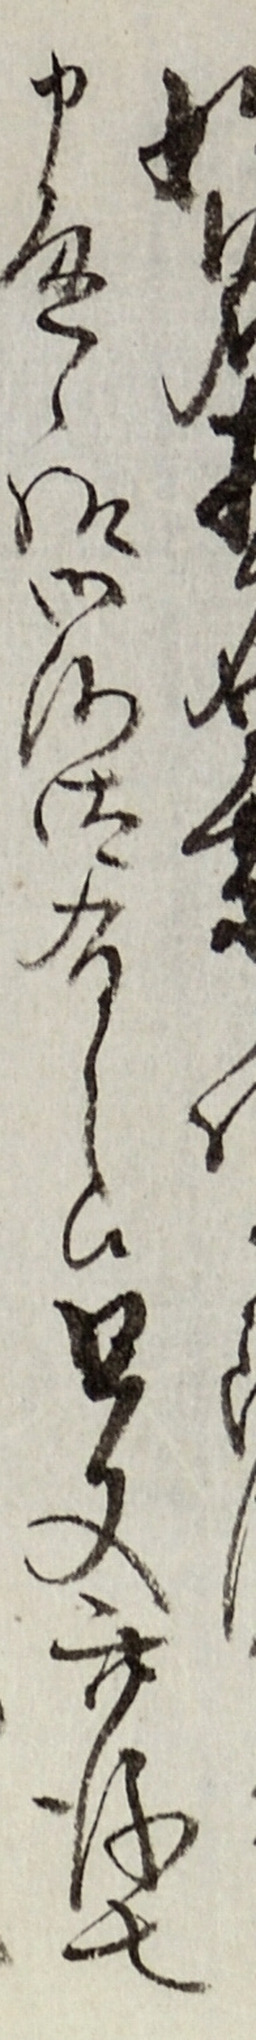申通候様御沙汰有之候且又此後者
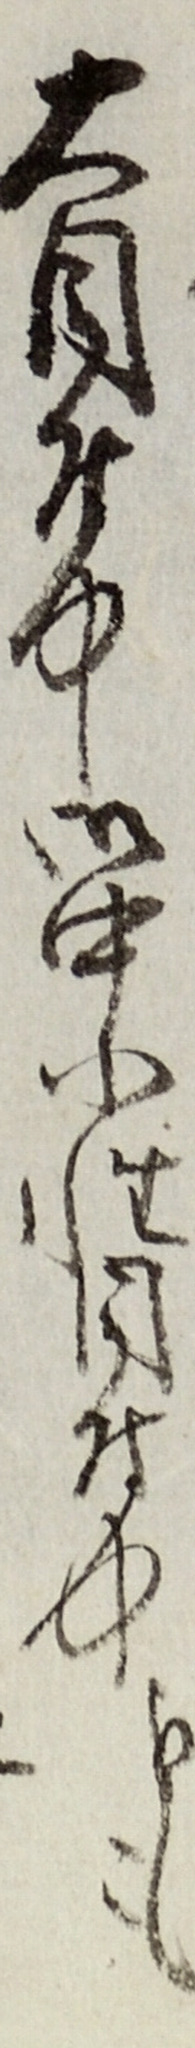大目付中御中小性目付中江も
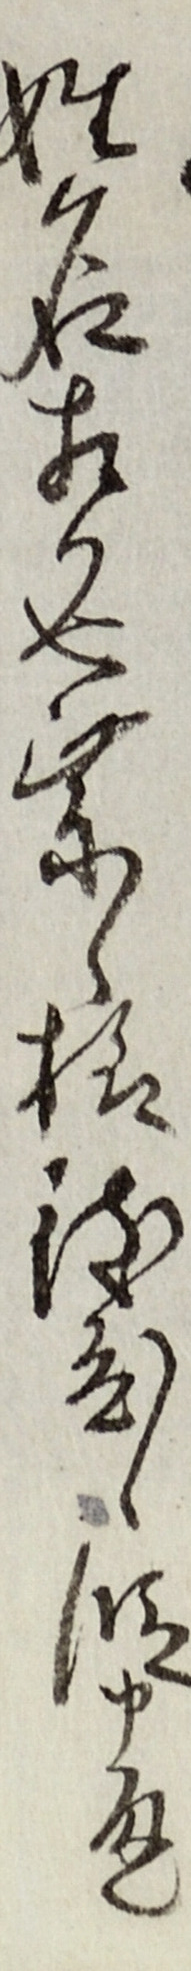姓名相名乗候様致度候段申通
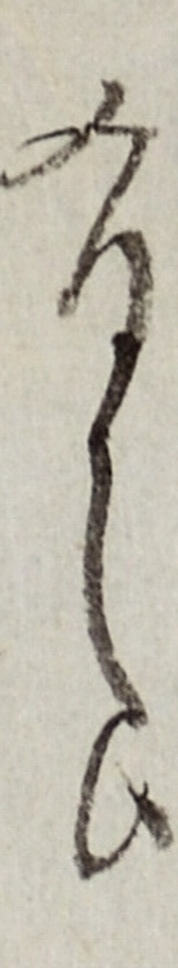有之候
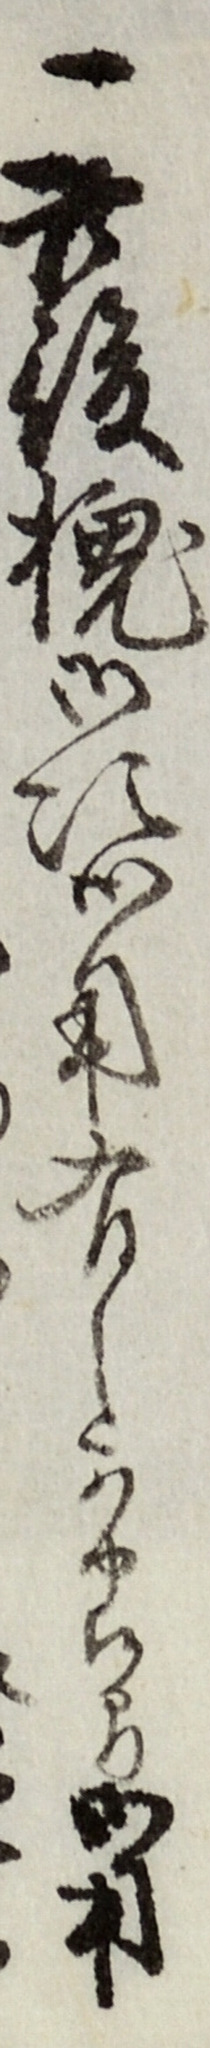一此後槐御次御用有之可申候間御用
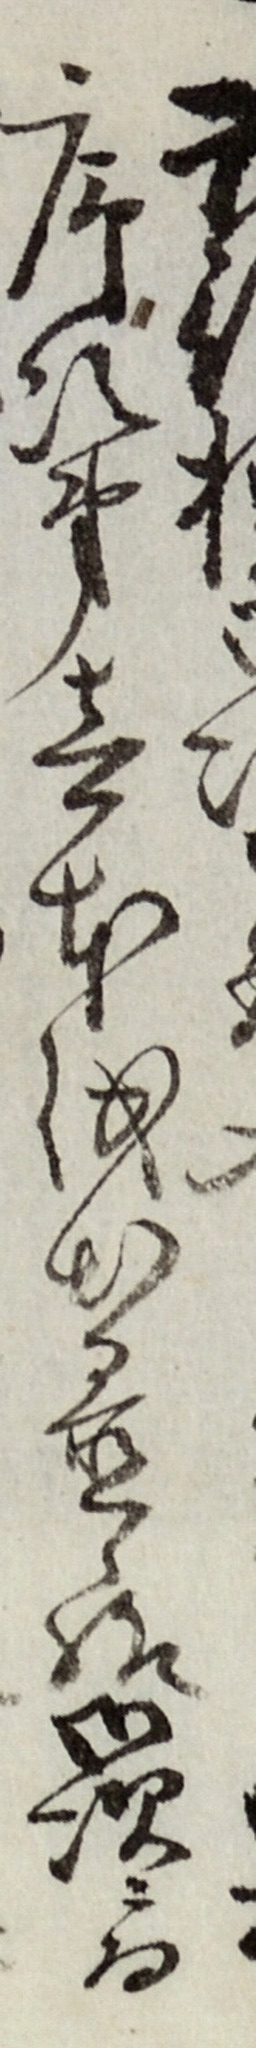序次第壱本伐出置候様御次ニ而
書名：御山方御薪方諸事御用留
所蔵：伊那市立高遠町図書館・合同会社AMANE
